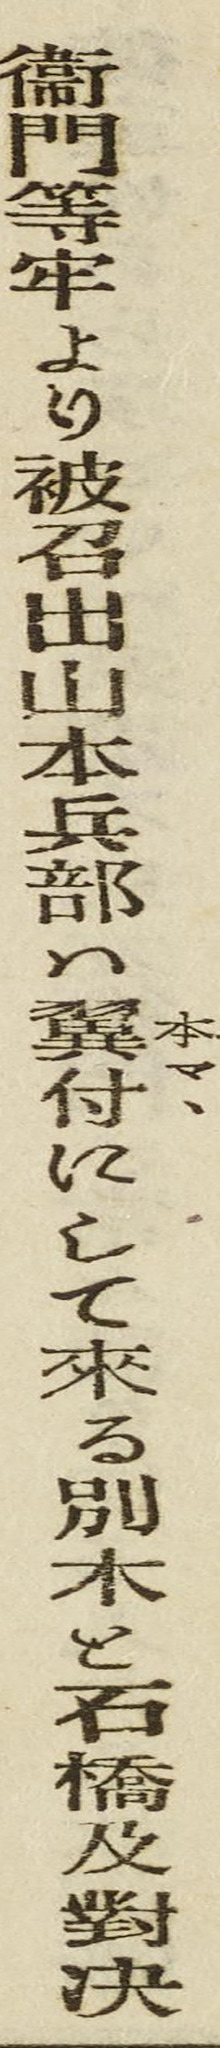衞門等牢より被召出山本兵部は翼付にして来る別木と石橋及対決
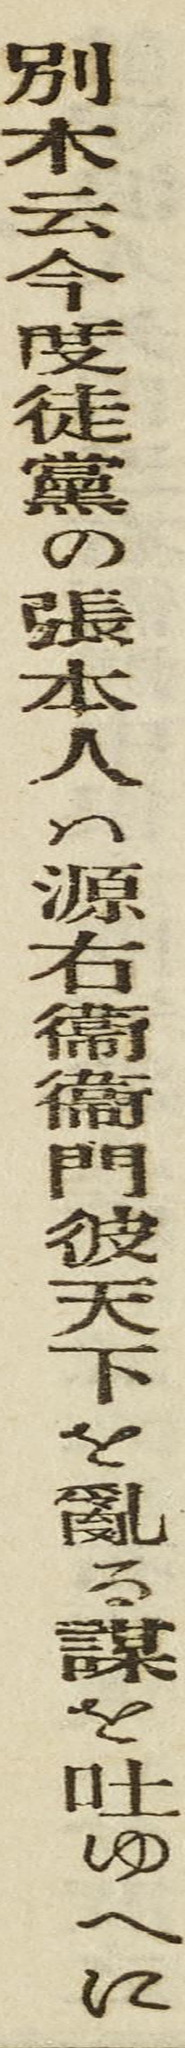別木云今度徒党の張本人は源右衞門彼天下を乱る謀を吐ゆへに
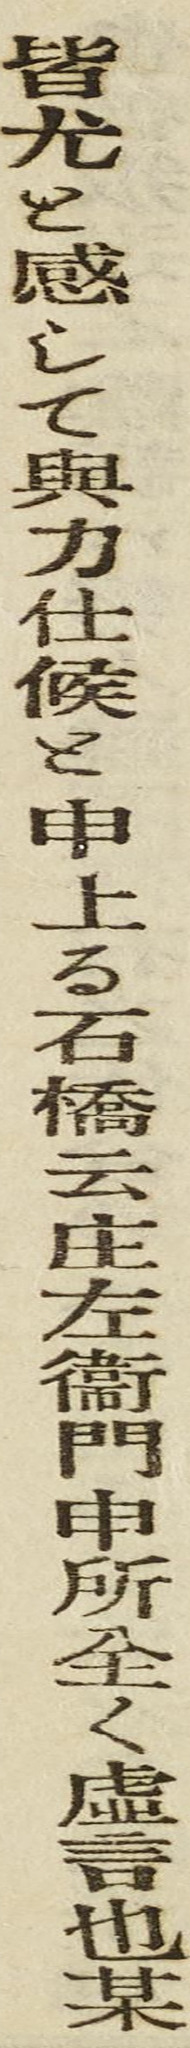皆尤と感して与力仕候と申上る石橋云庄左衞門申所全く虚言也某
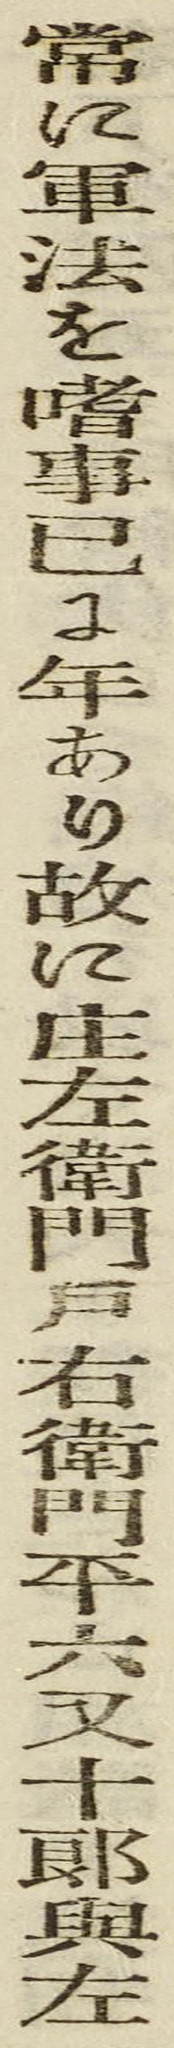常に軍法を嗜事已に年あり故に庄左衛門戸右衛門平六又十郎左
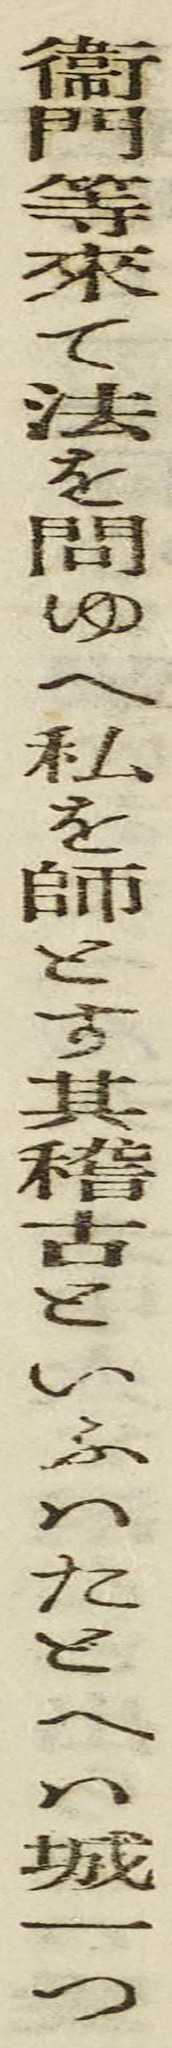衞門等来て法を問ゆへ私を師とす其稽古といふはたとへは城一つ
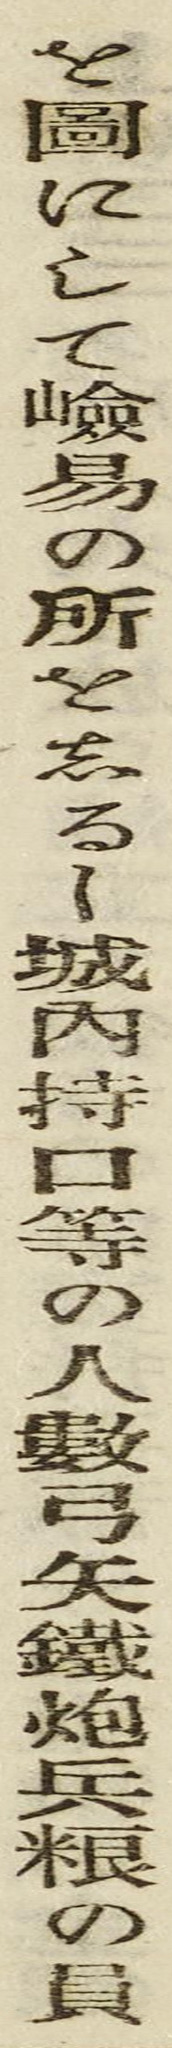を図にして嶮易の所をしるし城内持口等の人数弓矢鉄炮兵粮の員
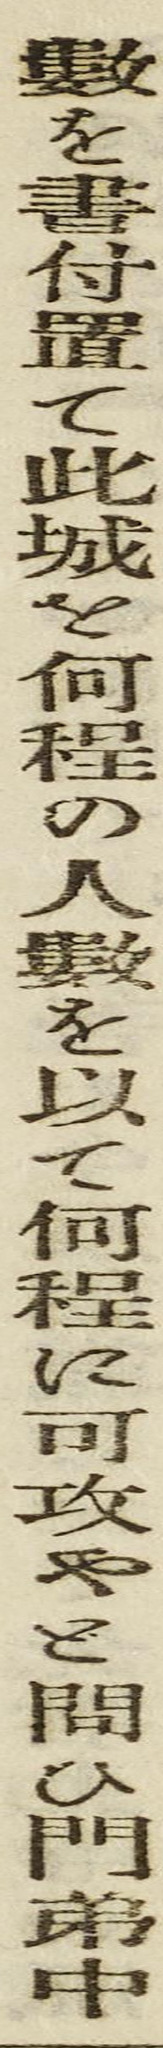数を書付置て此城を何程の人数を以て何程に可攻やと問ひ門弟中
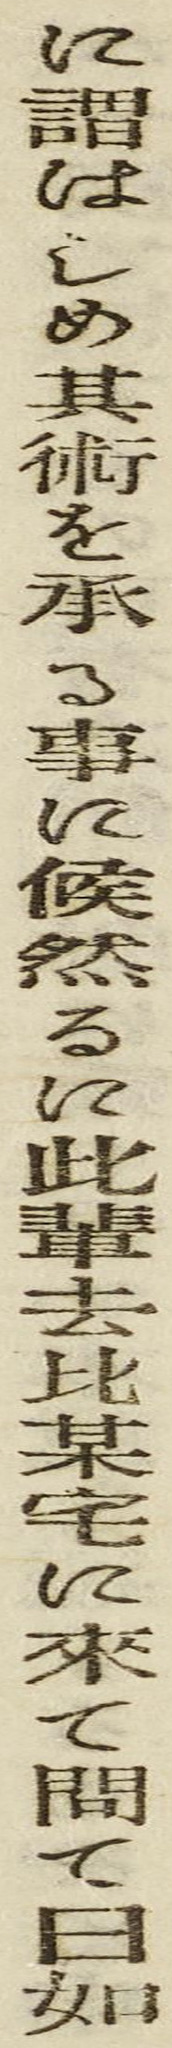に謂はしめ其術を承る事に候然るに此輩去比某宅に来て問て曰如
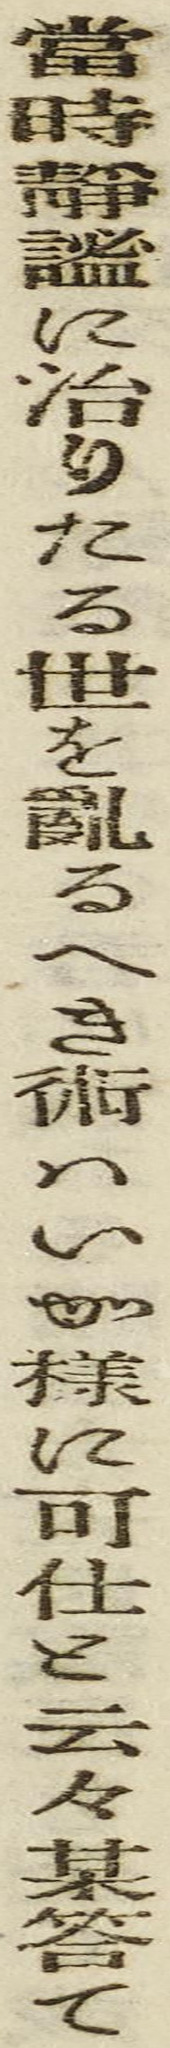当時静謐に治りたる世を乱るへき術はいか様に可仕と云々某答て
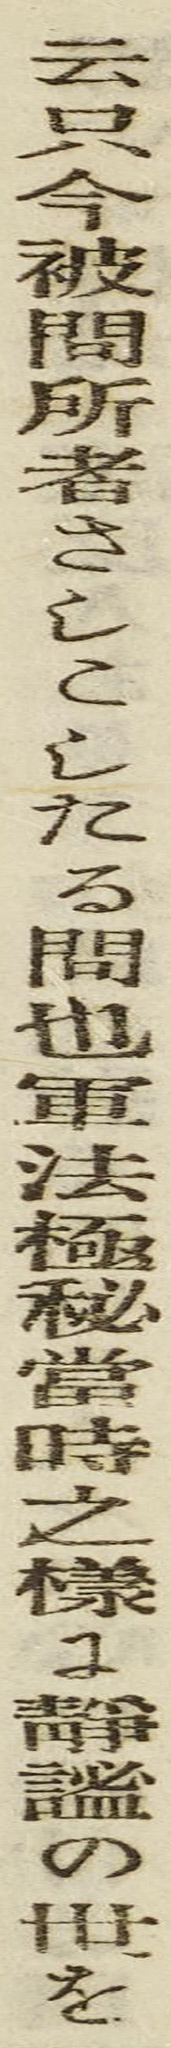云只今被問所者さしこしたる問也軍法極秘当時之様に静謐の世を
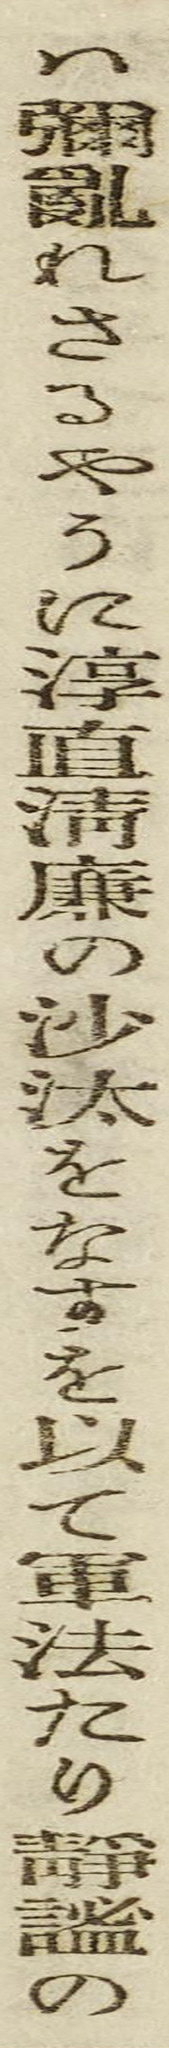は弥乱れさるやうに淳直清廉の沙汰をなすを以て軍法たり静謐の
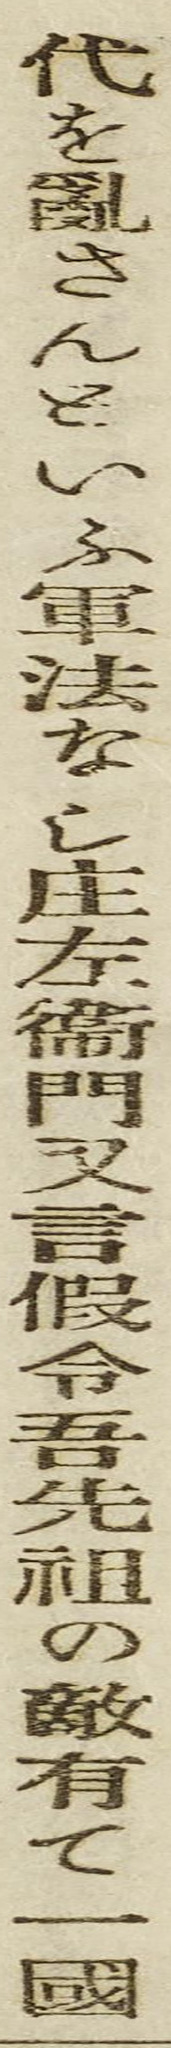代を乱さんといふ軍法なし庄左衞門又言仮令吾先祖の敵有て一国
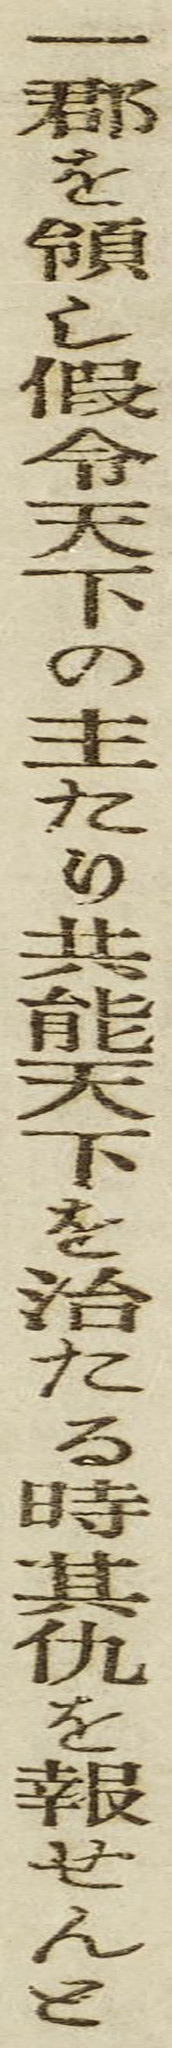一郡を領し仮令天下の主たり共能天下を治たる時其仇を報せんと
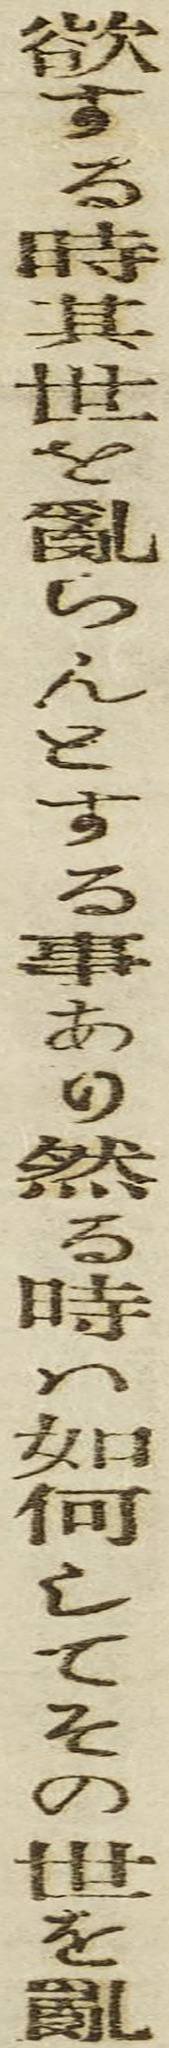欲する時其世を乱らんとする事あり然る時は如何してその世を乱

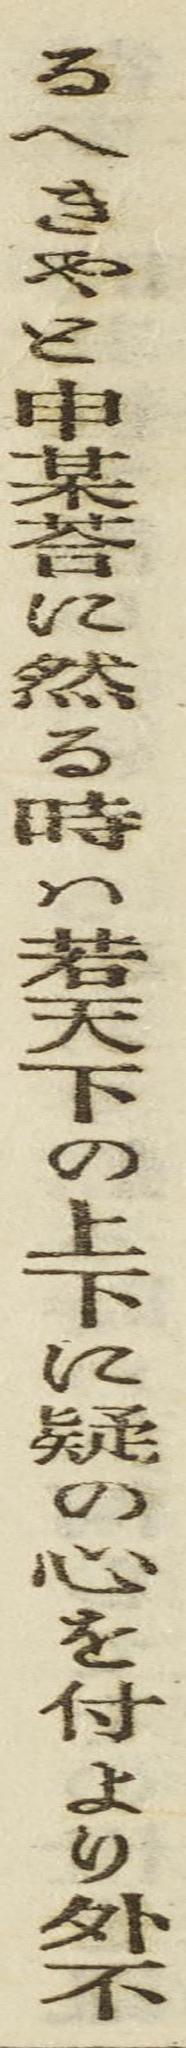るへきやと申某答に然る時は若天下の上下に疑の心を付より外不
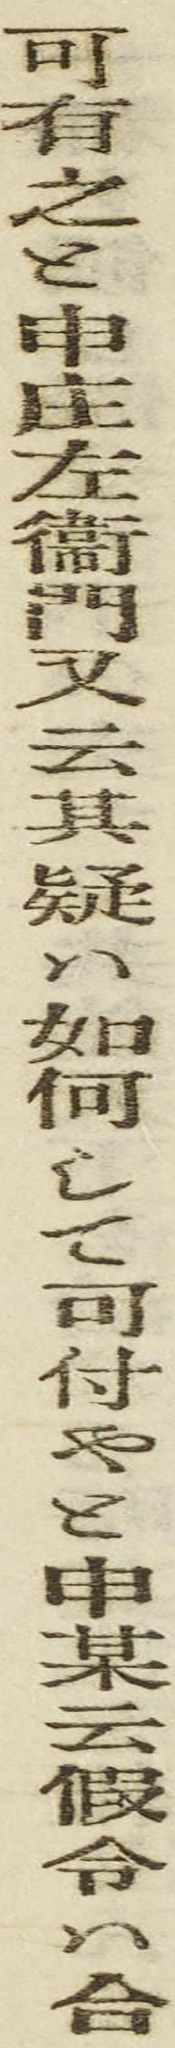可有之と申庄左衞門又云其疑い如何して可付やと申某云仮令は合
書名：史籍集覽　朝鮮陣古文・細井廣澤記・颶風紀事・天明七年將軍宣下次第書　全
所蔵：東京大学地震研究所図書室 Earthquake Research Institute Library, The University of Tokyo, JAPAN
